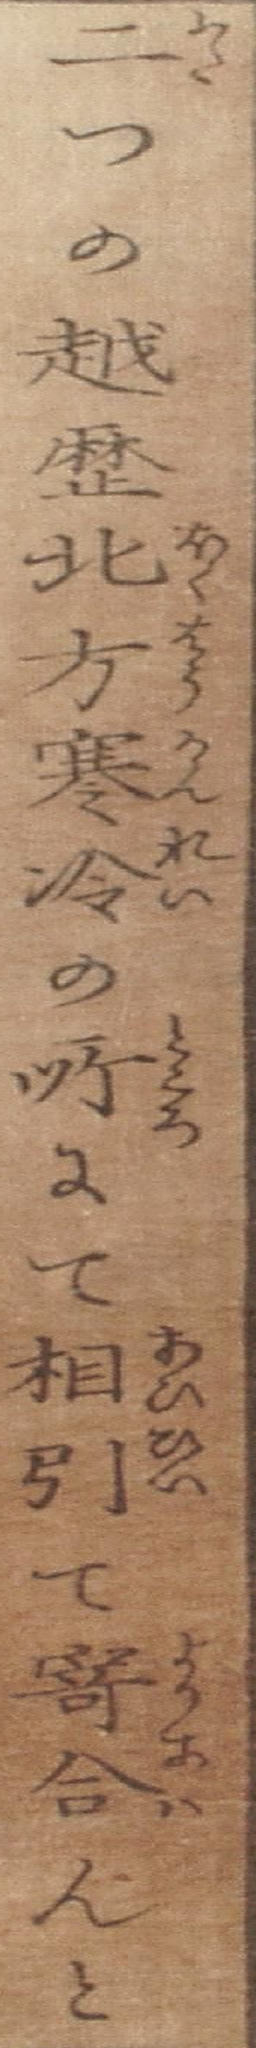二つの越歴北方寒冷の所にて相引て寄合んと
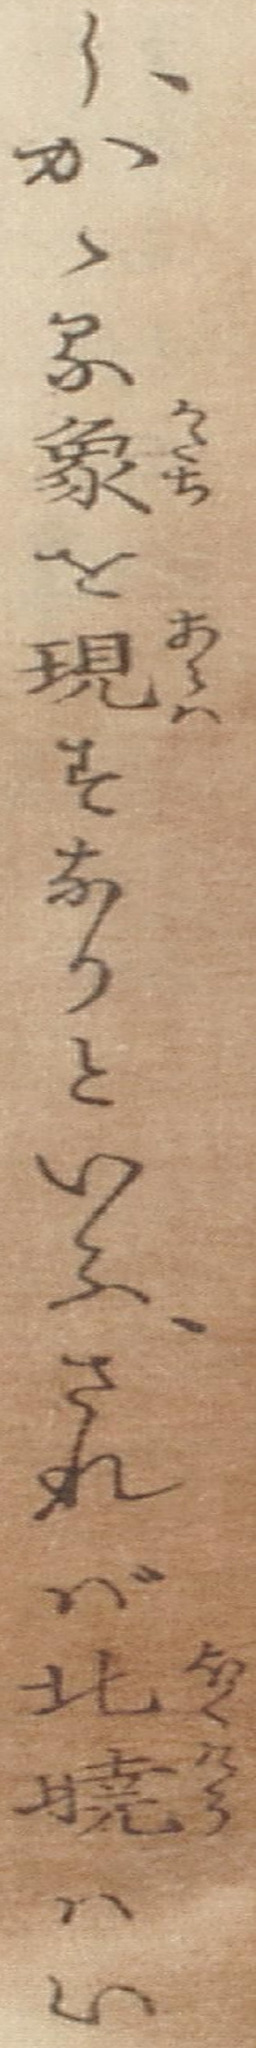し、かゝる象を現すなりといふ、されば北暁はい
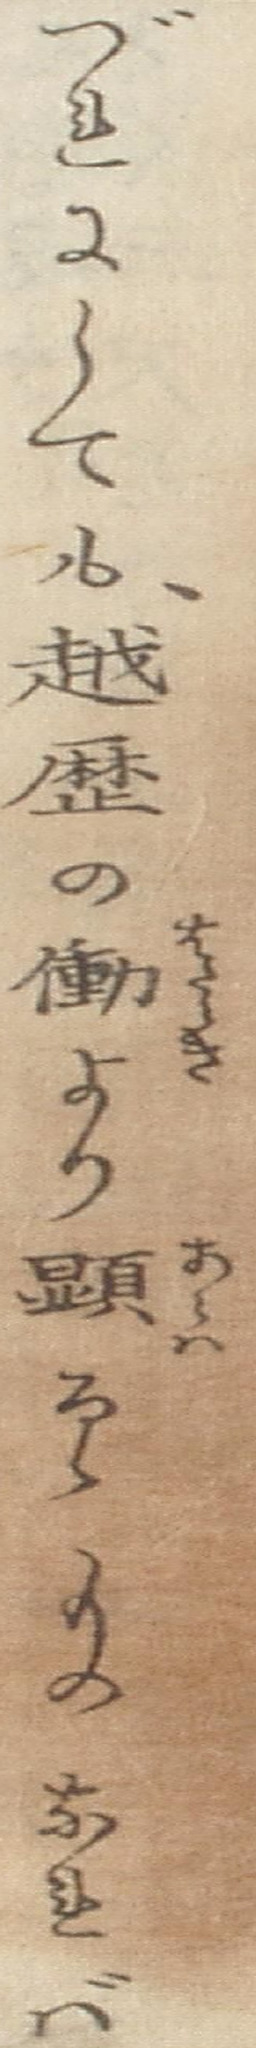づれにしても、越歴の働より顕るゝものなれば
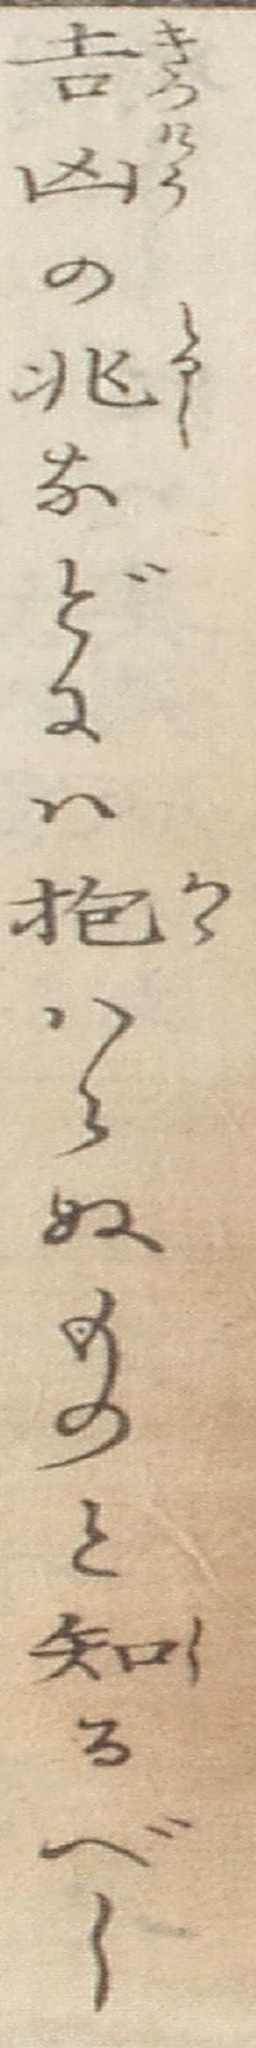吉凶の兆などには抱はらぬものと知るべし
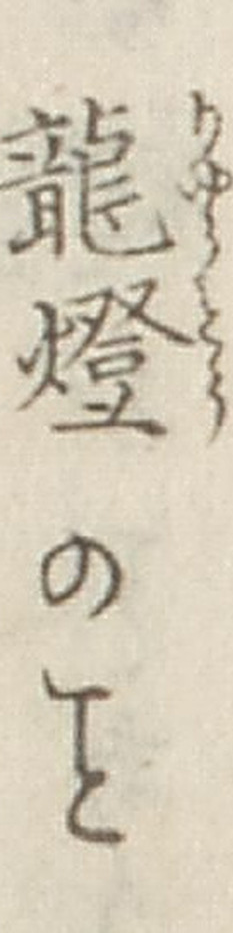龍燈のこと
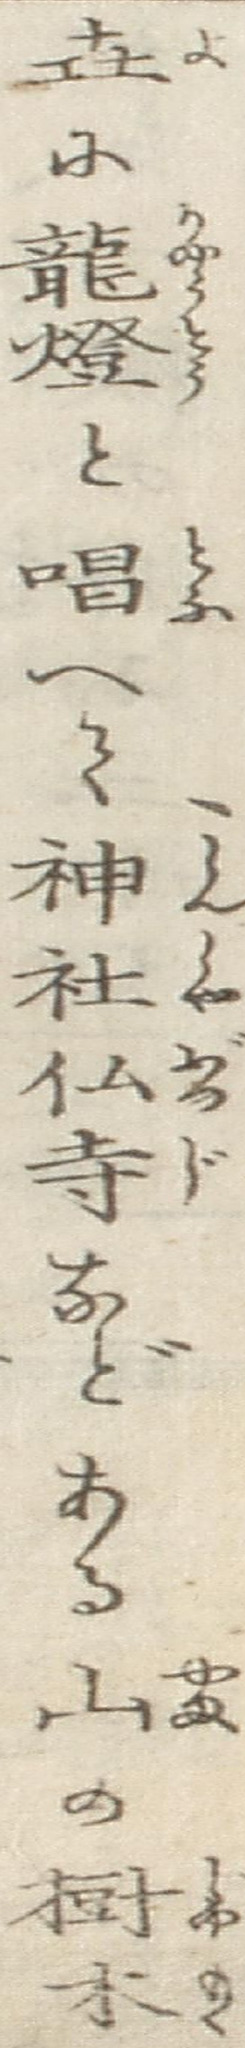世に龍燈と唱へて、神社仏寺などある山の樹木
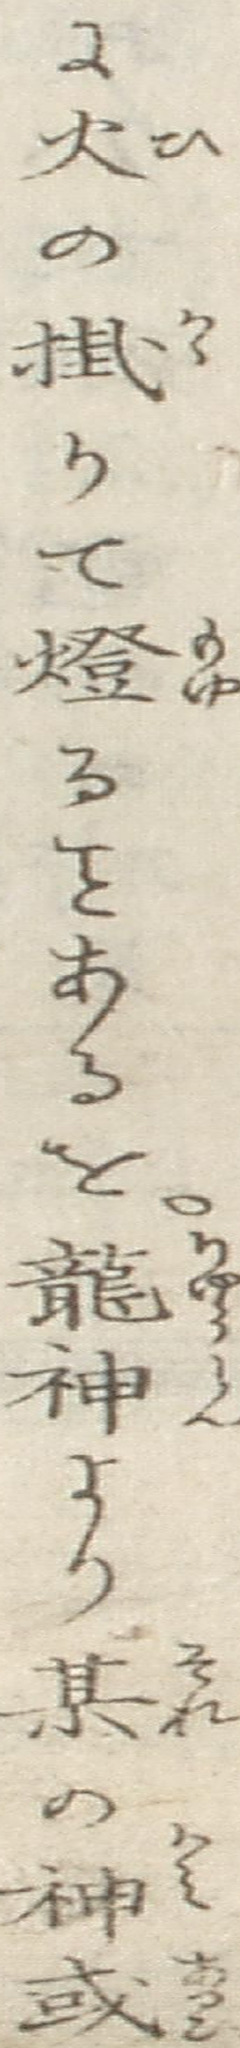に火の掛りて燈ることあるを。龍神より某の神或
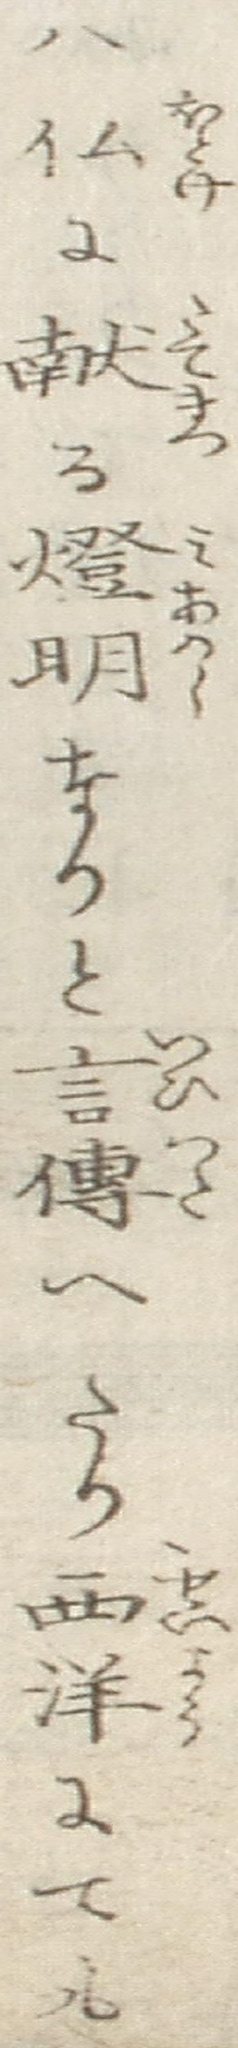は仏に献る燈明なりと言伝へたり、西洋にても
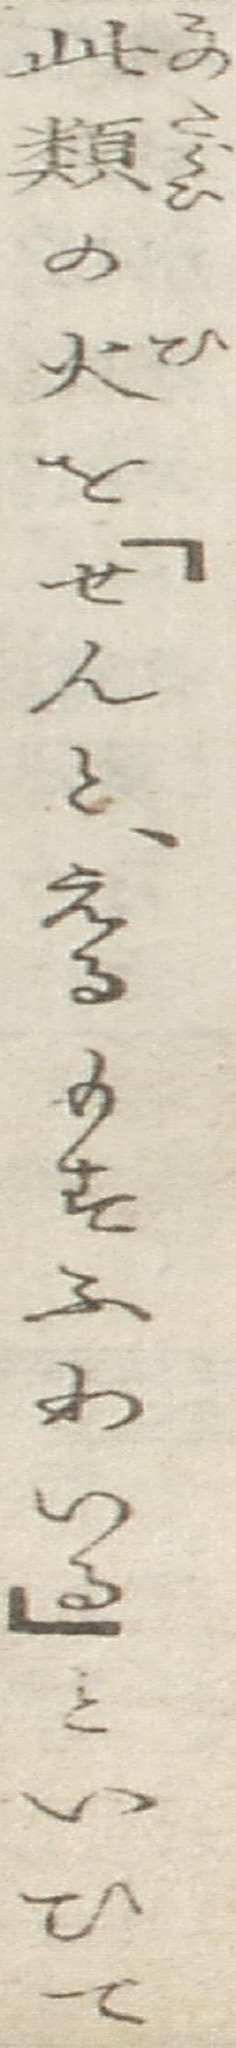此類の火を「せんと、えるもすふわいる」といひて

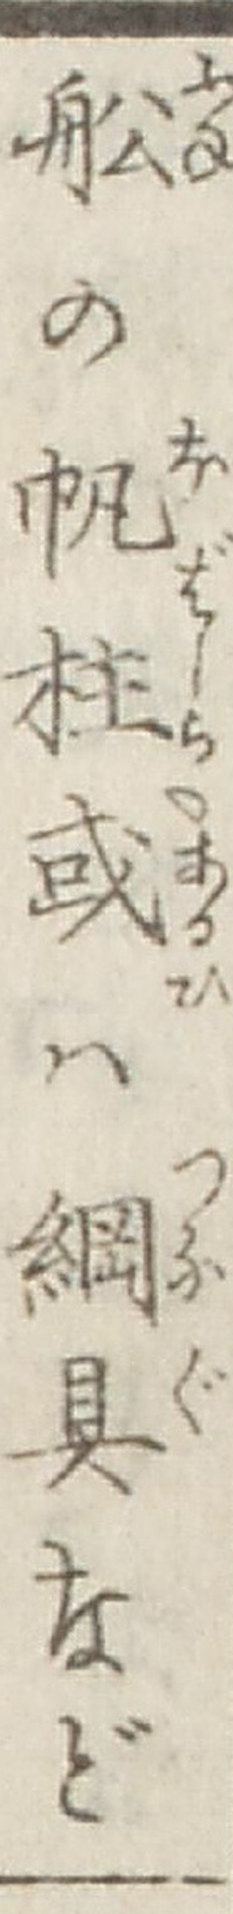船の帆柱。或は綱具など
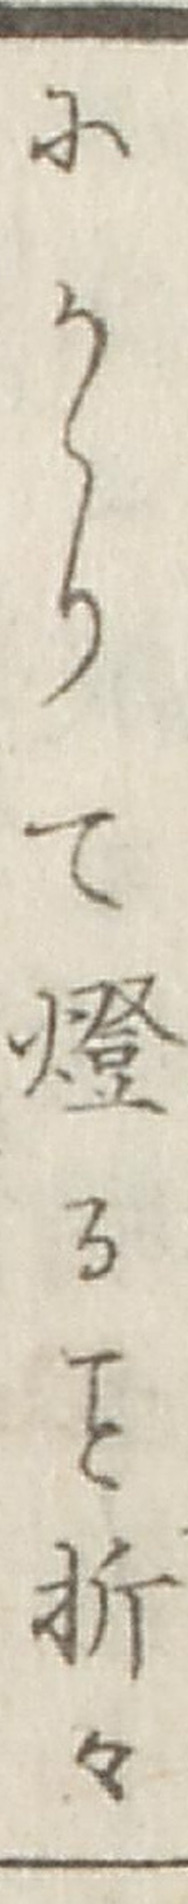にかゝりて燈ること折々
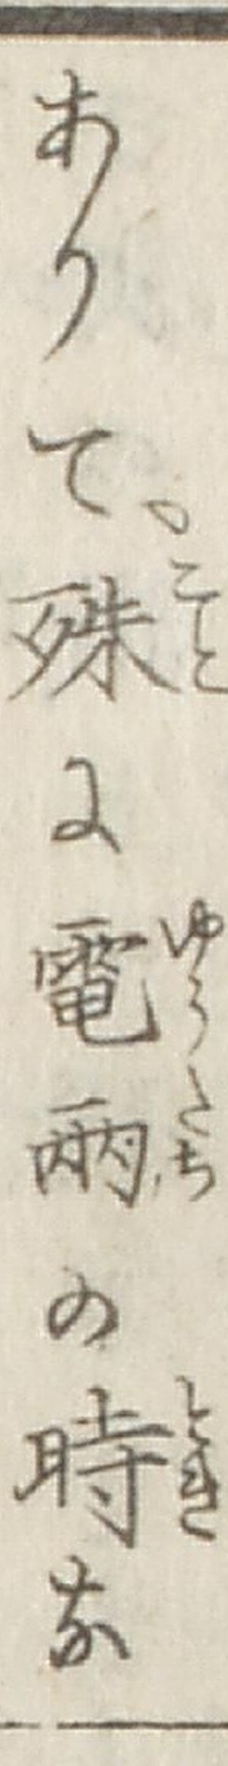ありて。殊に電雨の時な
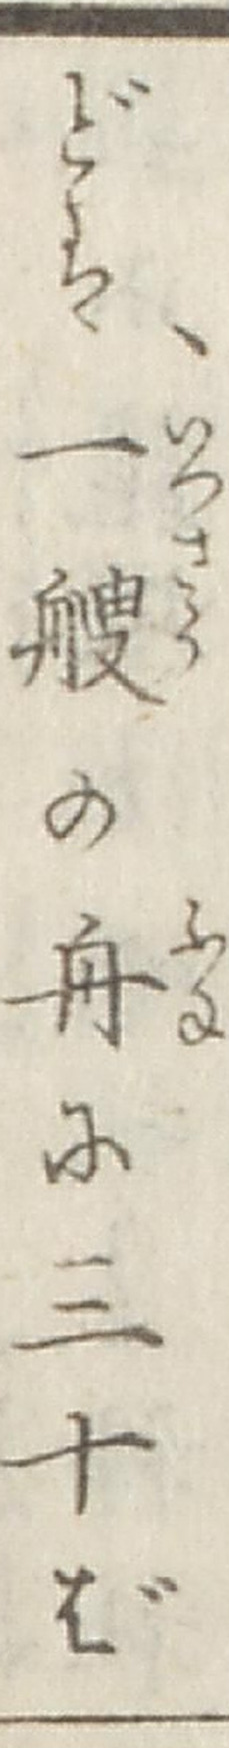どは、一艘の舟に三十ば
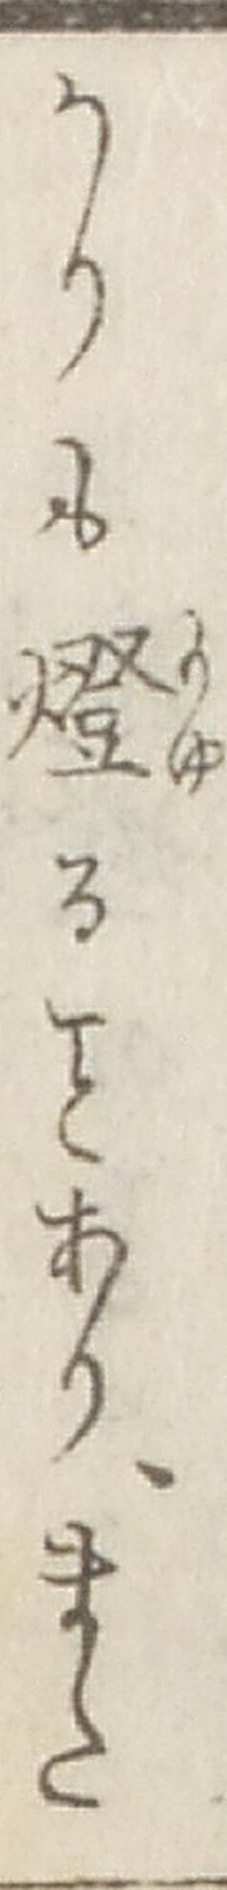かりも燈ることあり、また
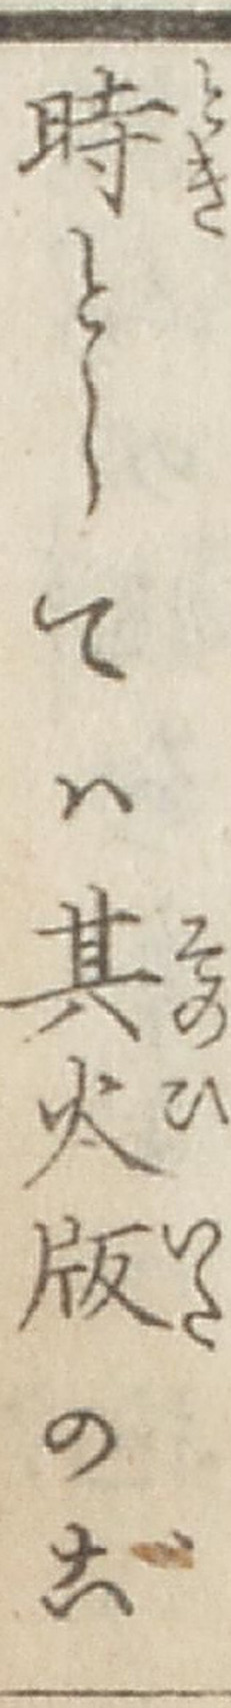時としては其火版のご
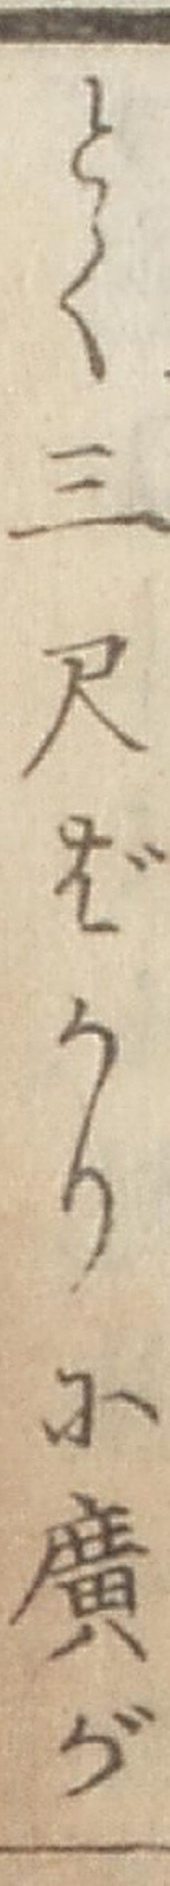とく。三尺ばかりに広が
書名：変異辯　一名、天變地異拾遺　全
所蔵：東京大学地震研究所図書室 Earthquake Research Institute Library, The University of Tokyo, JAPAN
